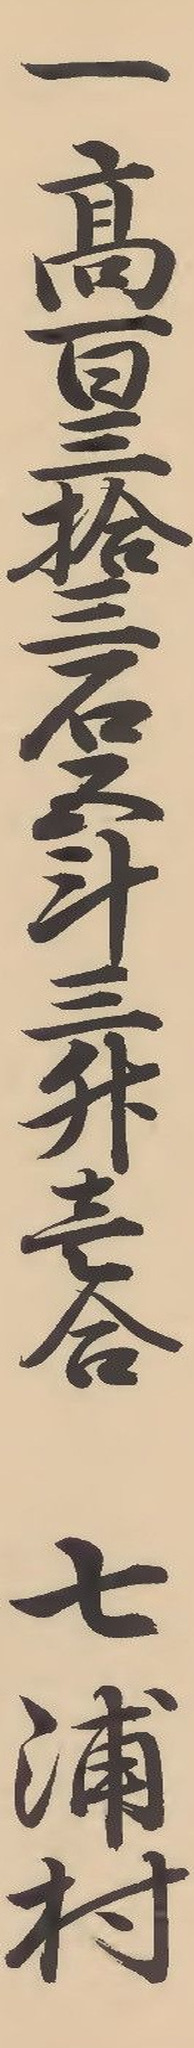一高百三拾三石五斗三升壱合七浦村
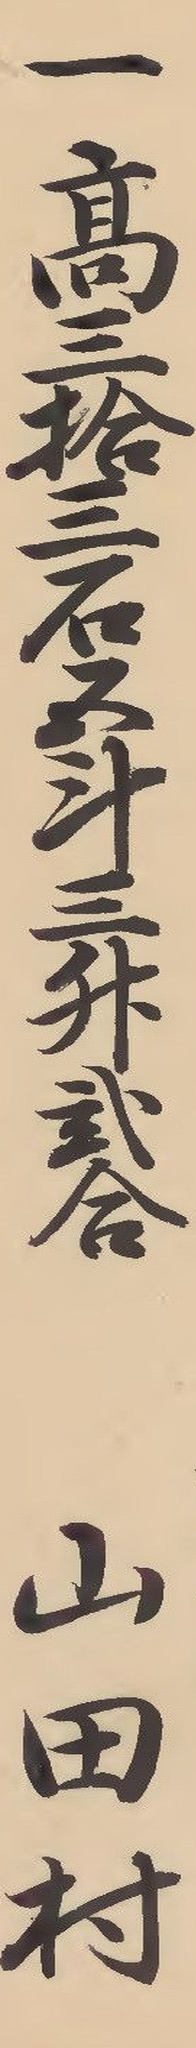一高三拾三石五斗三升弐合山田村

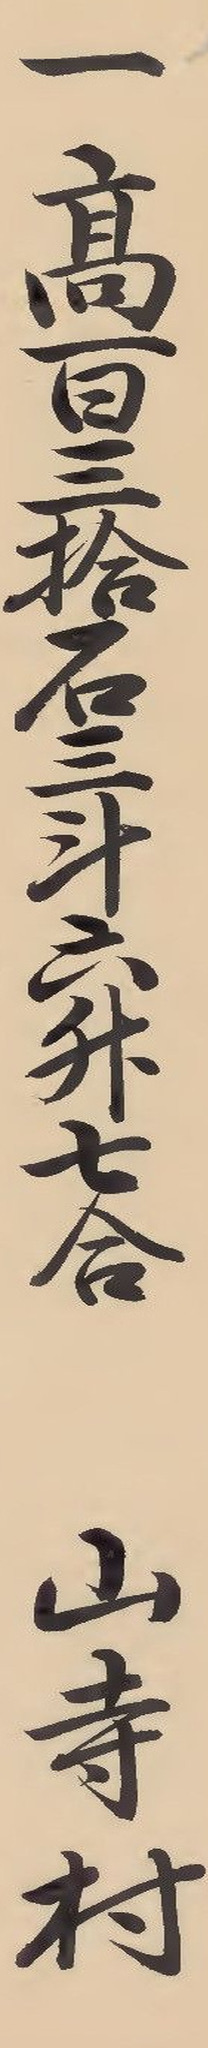一高百三拾石三斗六升七合山寺村
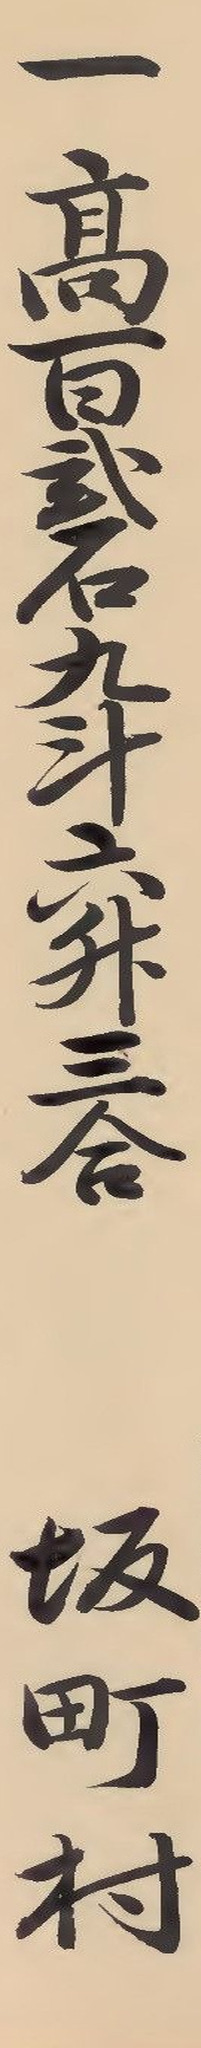一高百弐石九斗六升三合坂町村
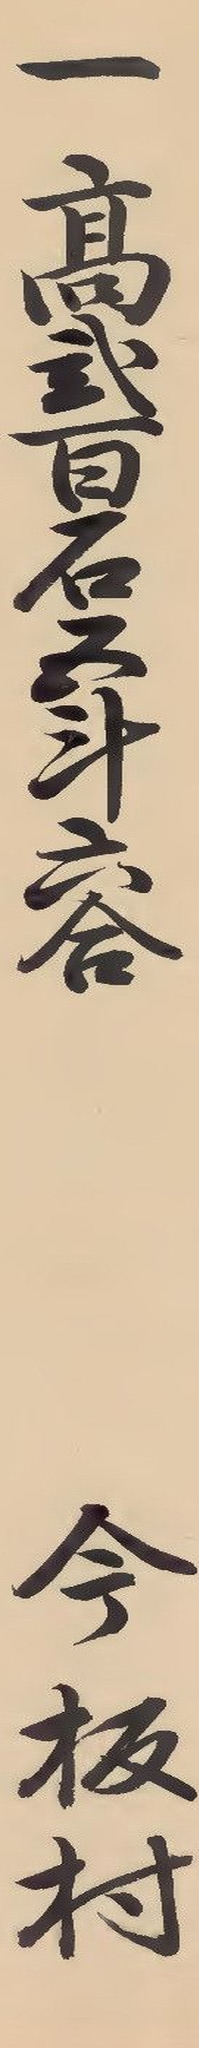一高弐百石五斗六合今板村
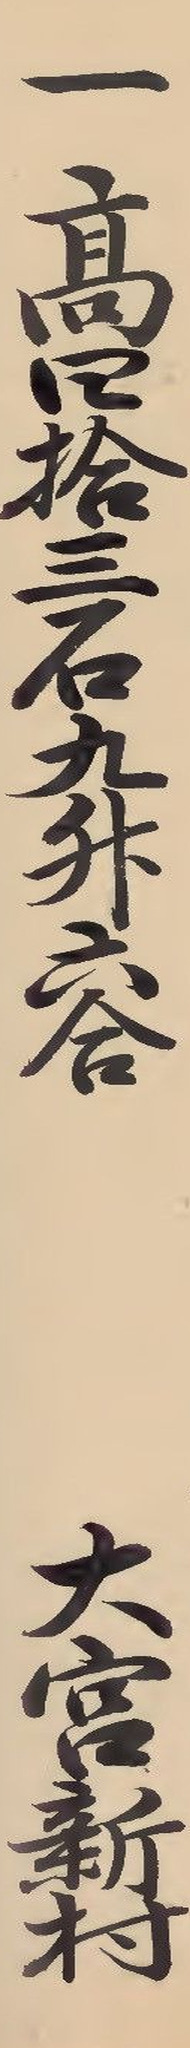一高四拾三石九升六合大宮新村
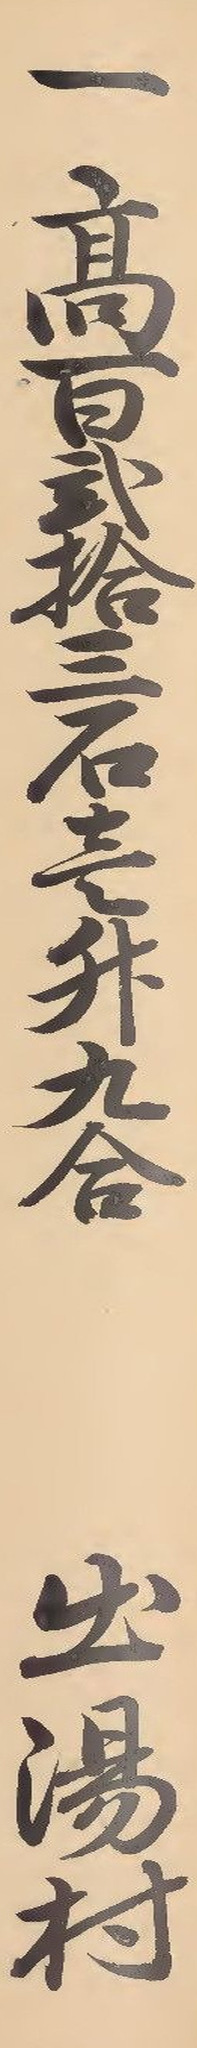一高百弐拾三石壱升九合出湯村
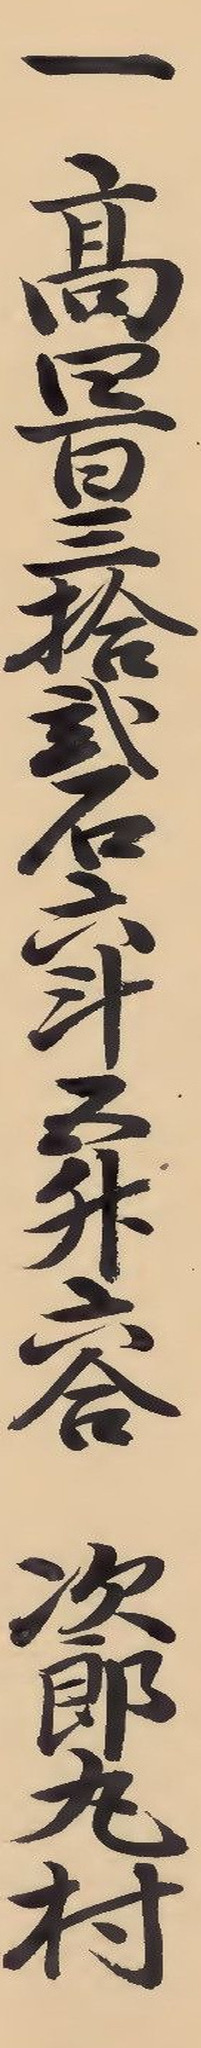一高四百三拾弐石六斗五升六合次郎丸村
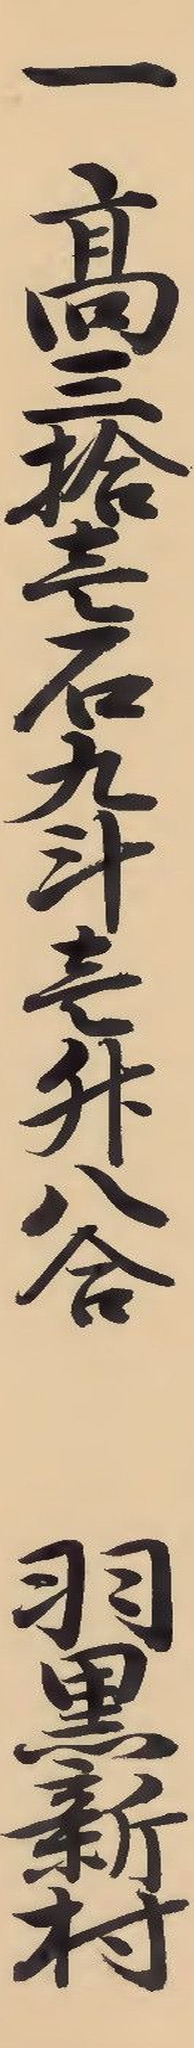一高三拾壱石九斗壱升八合羽黒新村
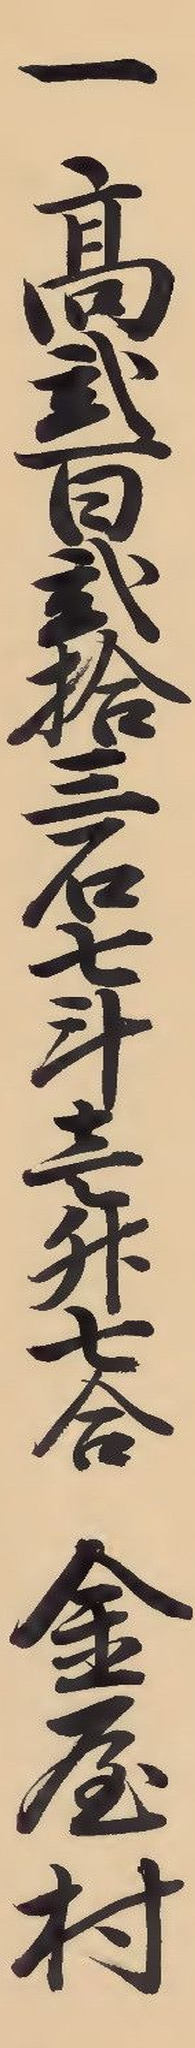一高弐百弐拾三石七斗壱升七合金屋村

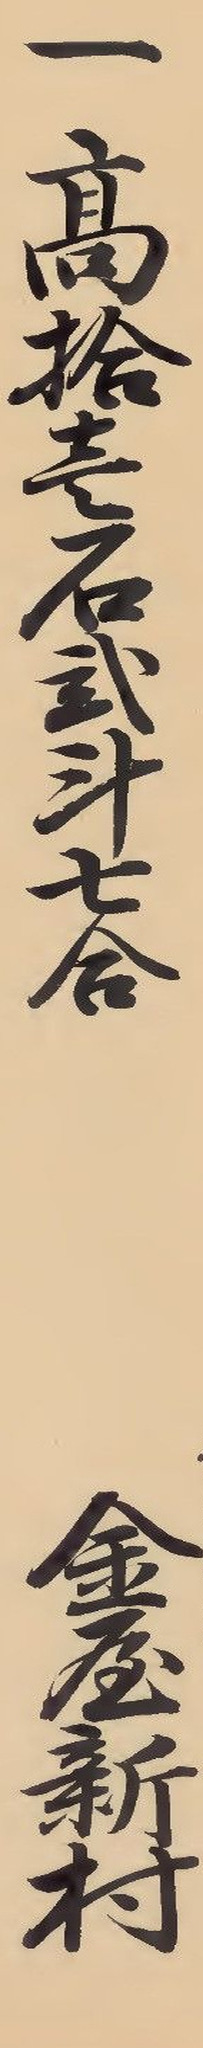一高拾壱石弐斗七合金屋新村
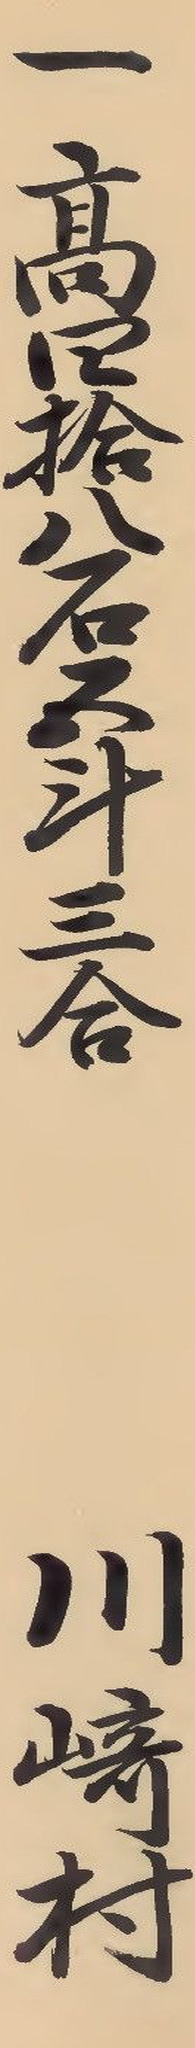一高四拾八石五斗三合川崎村
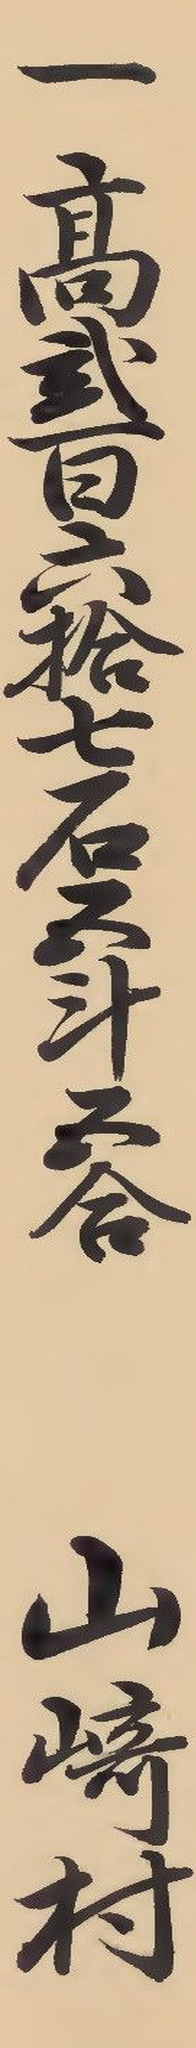一高弐百六拾七石五斗五合山崎村
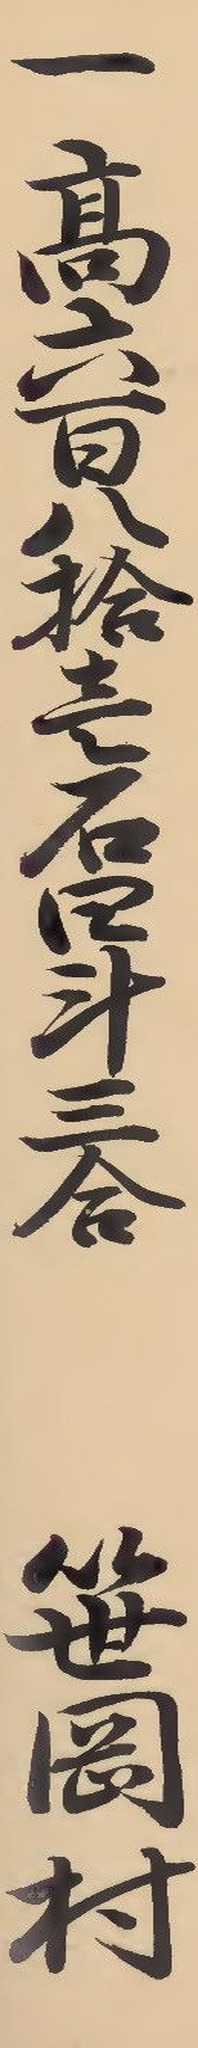一高六百八拾壱石四斗三合笹岡村
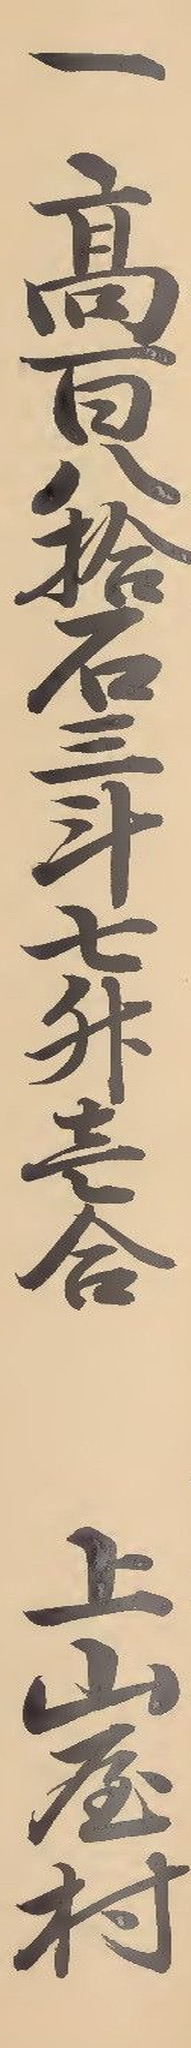一高百八拾石三斗七升壱合上山屋村
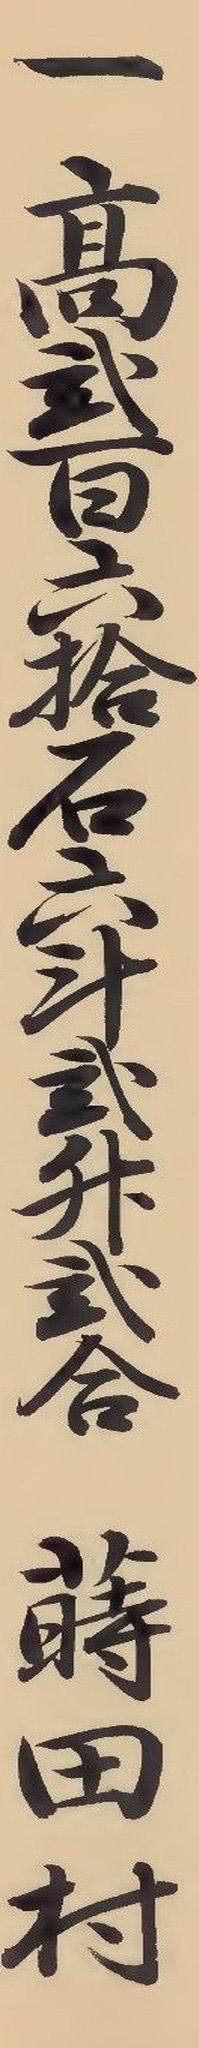一高弐百六拾石六斗弐升弐合蒔田村
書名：越後国郷帳　下
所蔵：国立公文書館 National Archives of Japan
